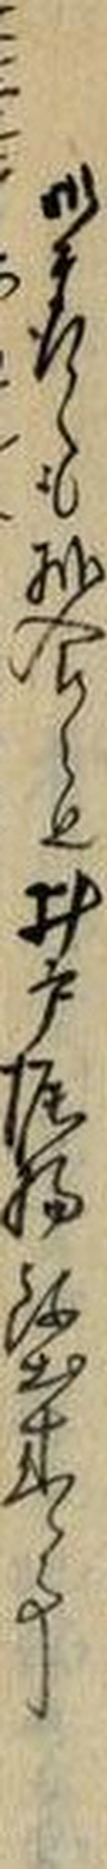御奉行へも掛合之上井戸堀揚致出来候事
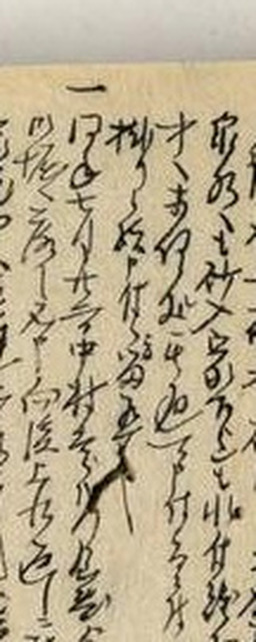掛り候様申付候旨留有之
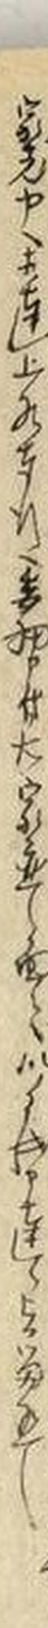家老中へ相達上水奉行へ委細申付右家並之面々へ以手紙申達候旨留有之

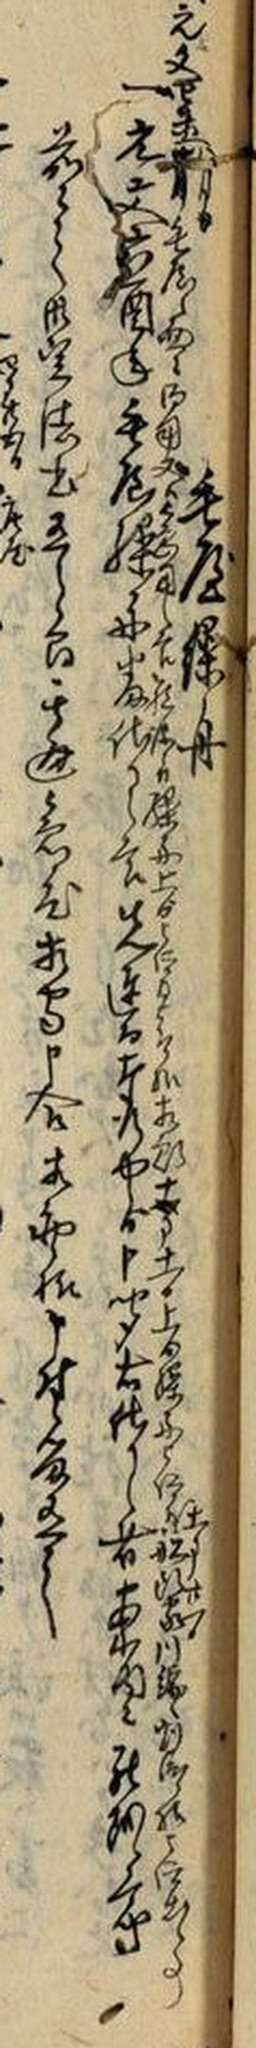一元文六酉年毛屋繰舟番代り之節先達て奉行中ゟ申聞右代り之者案内に罷越候節
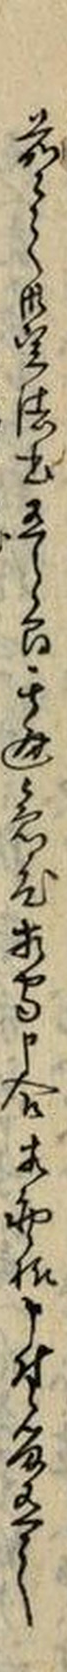前々之御定法書有之候間其通急度相守申合相勤候様申付候留有之
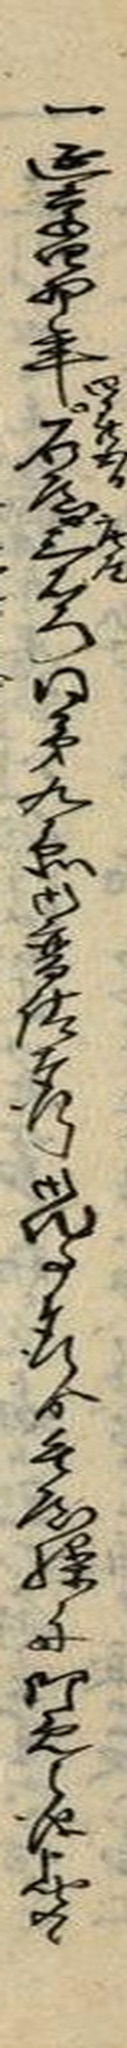一延享四卯年◦四月廿五日石屋◦庄屋三右衛門同弟九兵衛御普請奉行御作事奉行ゟ毛屋繰舟御免之儀申聞候
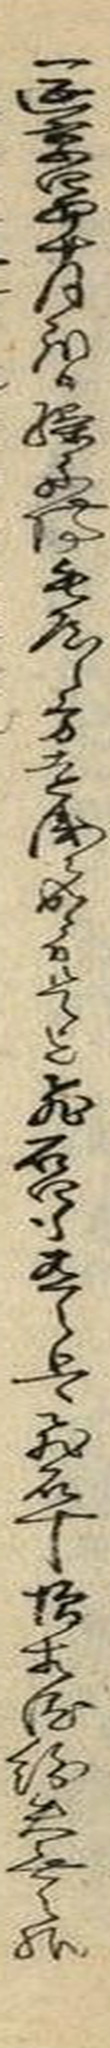一延享四卯十月朔日繰舟場毛屋之方遠浅に成候に付是迄飛石四ツ有之上へ飛石十増相渡紛失無之様
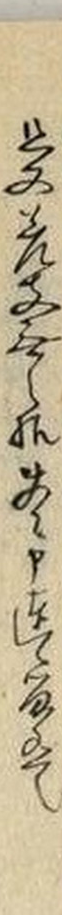且又差支無之様夫々申達候留有之
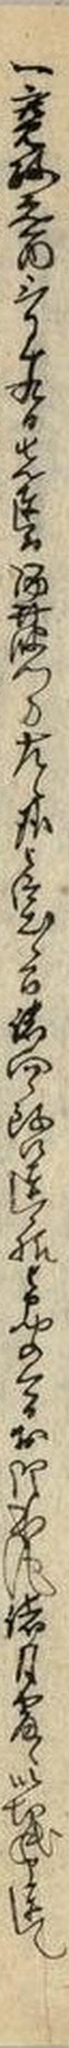一寛政元酉三月十九日先達て酒井波門方左之趣被仰出候間諸向へ致口達候様被申聞今日於御本丸詰月番へ以切紙申達之
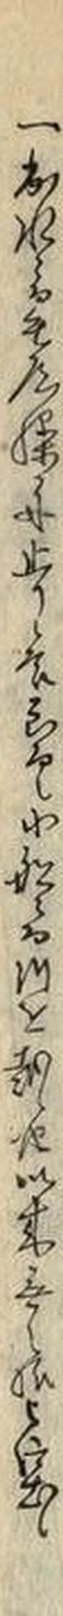一出水にて毛屋繰舟止り候節至ても小船にて川を越候儀以来無之様被仰出候
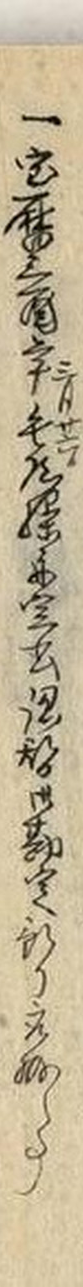一宝暦三酉年三月廿六日毛屋繰舟定書認替御勘定預り取扱之事
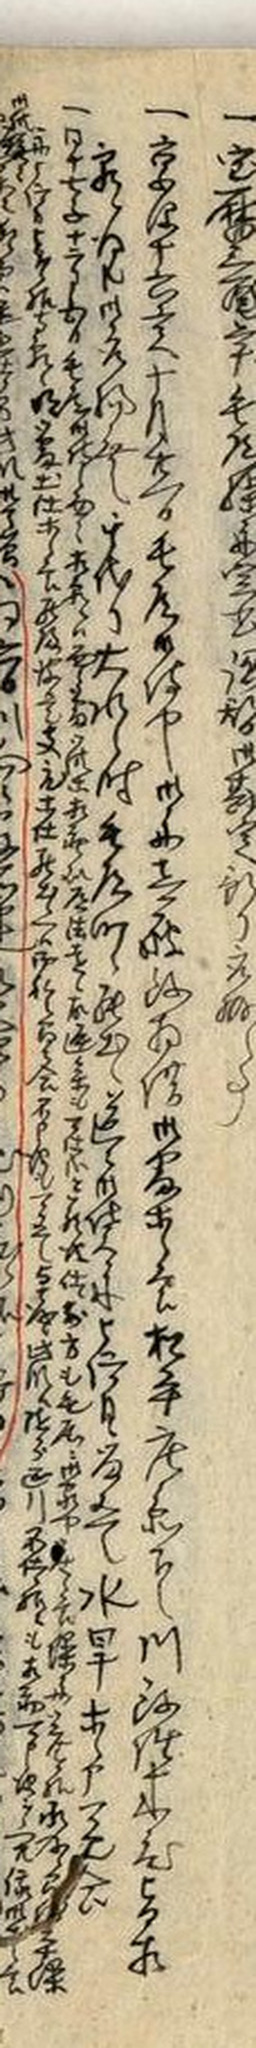願候得共御取揚無之其代り大水之時毛屋町へ罷出候道に御貸舟被仰付候留有之水旱等之中可見合
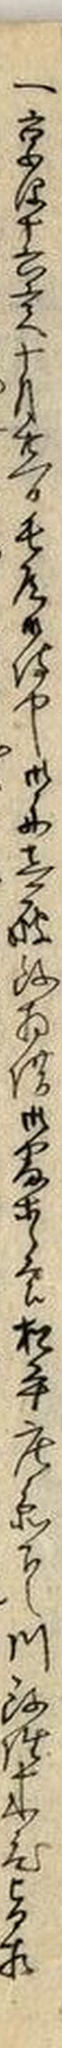一享保十六亥十月廿一日毛屋御侍中御舟壱艘致拝借御番等之節松平庄兵衛下之川致往来度旨相
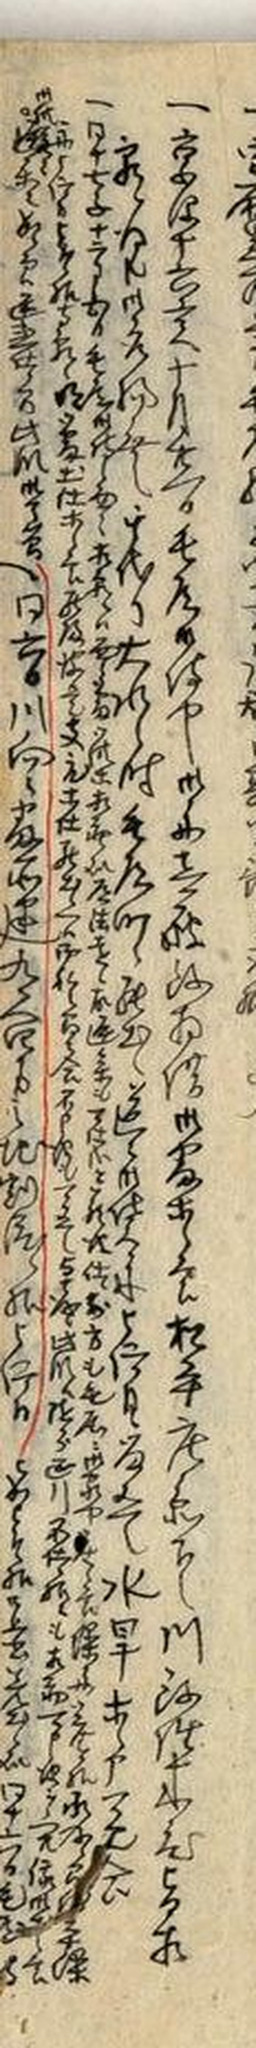願候得共御取揚無之其代り大水之時毛屋町へ罷出候道に御貸舟被仰付候留有之水旱等之中可見合
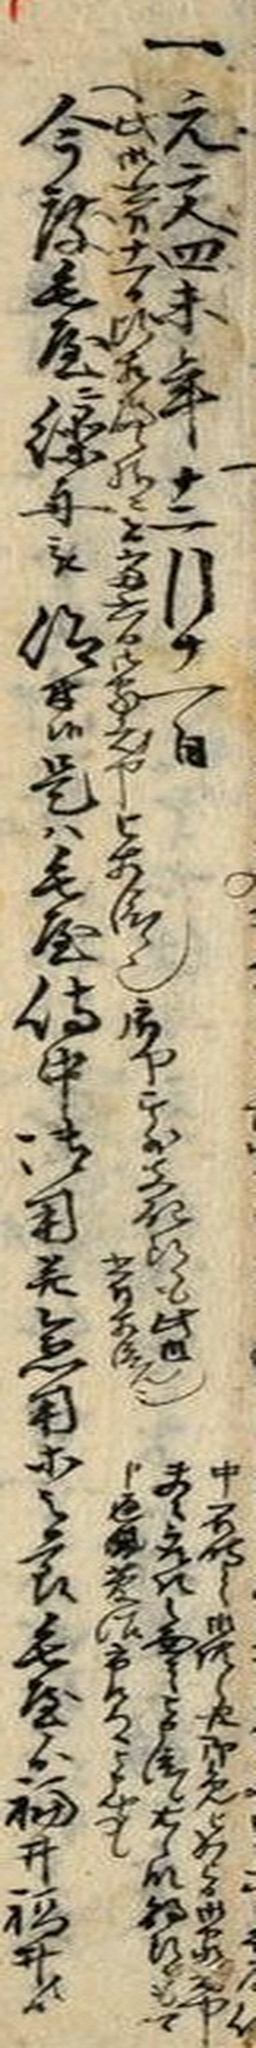今度毛屋に繰舟被仰付候是は毛屋侍中御用并急用等之節毛屋ゟ福井福井ゟ

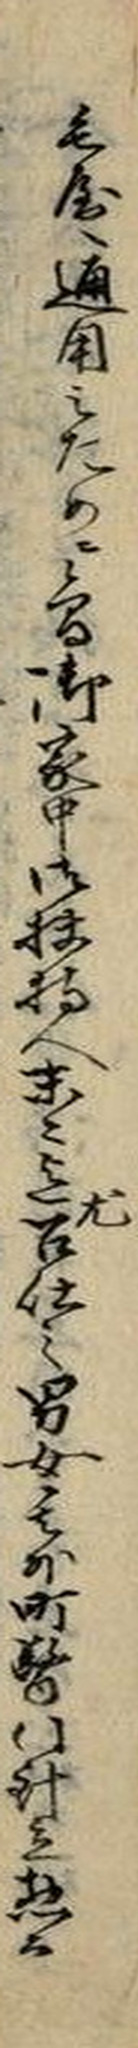毛屋へ通用之ために候間御家中御扶持人末々迄尤召仕之男女其外町医同針立惣て
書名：御城下諸事之部
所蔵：福井県文書館 Fukui Prefectural Archives
